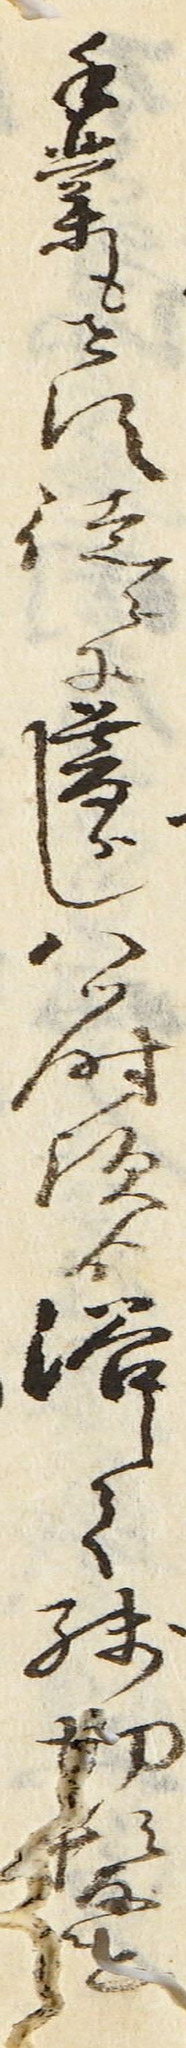手業もせす徒らに暮らし八ツ時頃ゟ浴して残切髪を
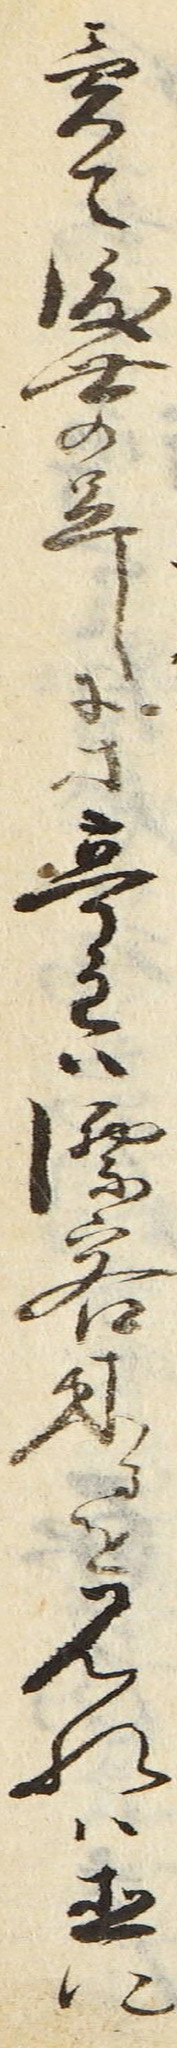売て渡世の足しにす亭主ハ漂客来るを見れハ直に

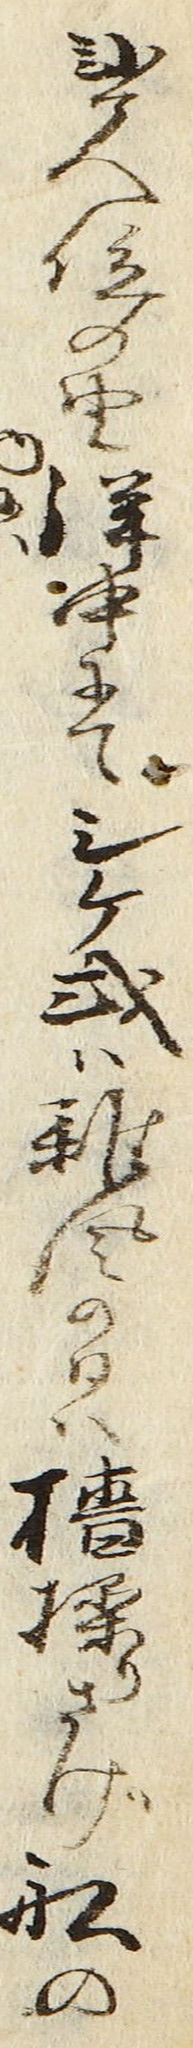弐尺位の由洋中にてシケ或ハ難風の日ハ檣操りさげ船の
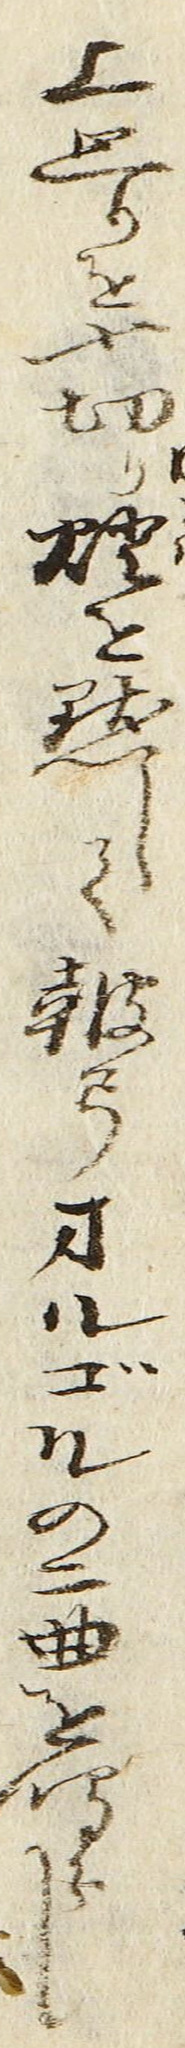上廻りを〆切り内にハ燈を点して鼓弓オルゴルの二曲を鳴らし
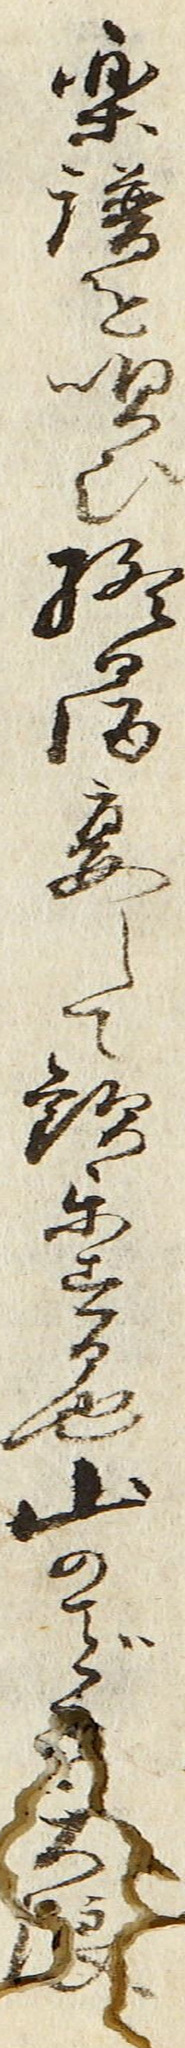楽譜を唄ひ終日酒宴して歓楽する也山のごとき大浪
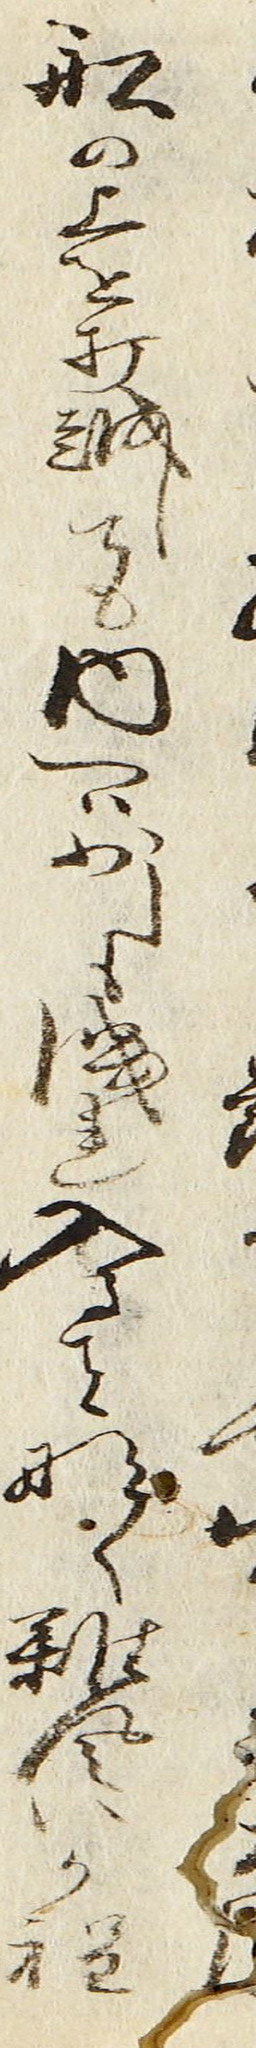船の上を打越しても内へハ少しも洩れ入ることなく難風いか程
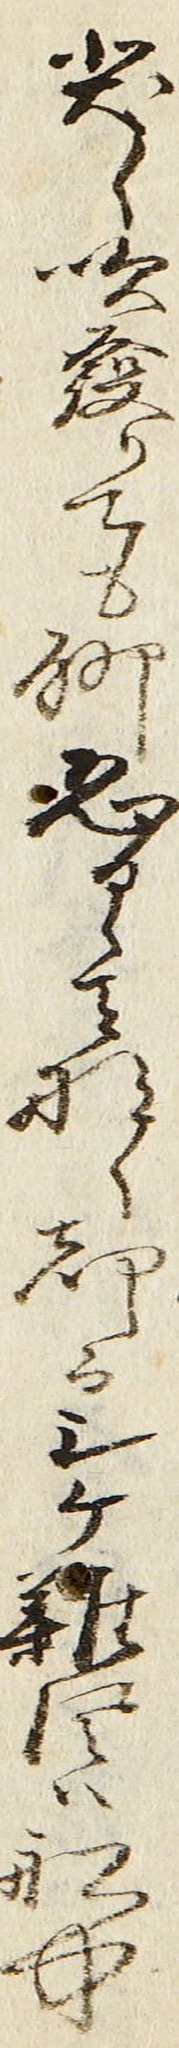尖く吹発りても聊恐るくことなく都而シケ難風ハ船中
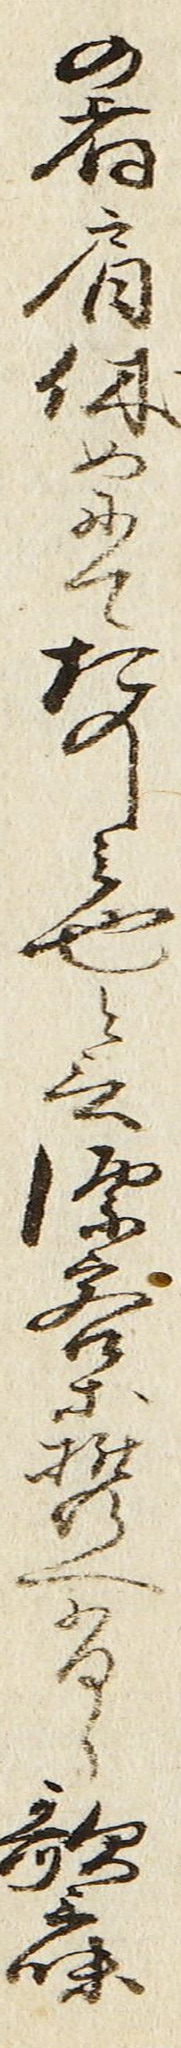の者肩休めにてたのしミ也と言漂客等携へ有し歌三昧
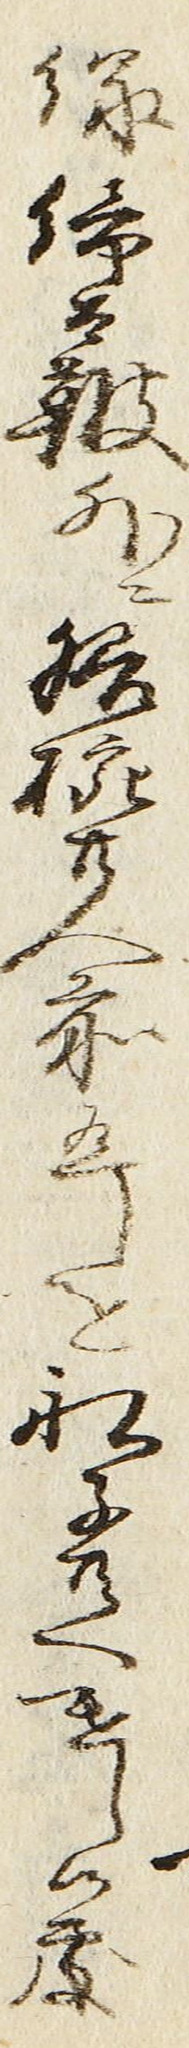線締太鼓外ニ膳椀廿人前有しを船子共へ遣し候処
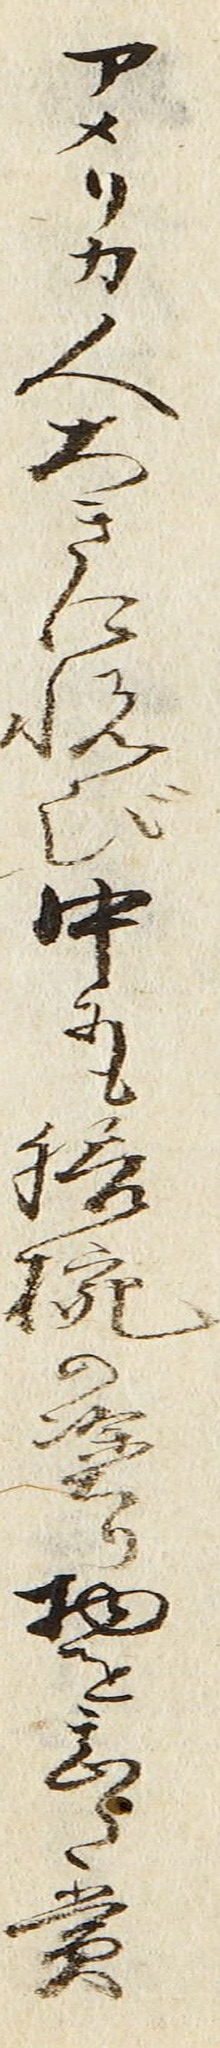アメリカ人大きに悦び中にも膳椀の塗り物を甚た賞
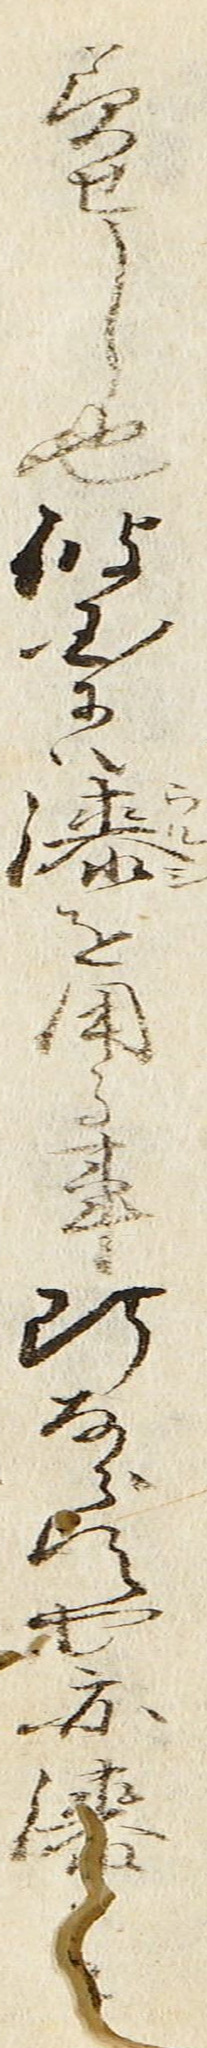美せし也彼国にハ漆を用る事断ならすや亦漆
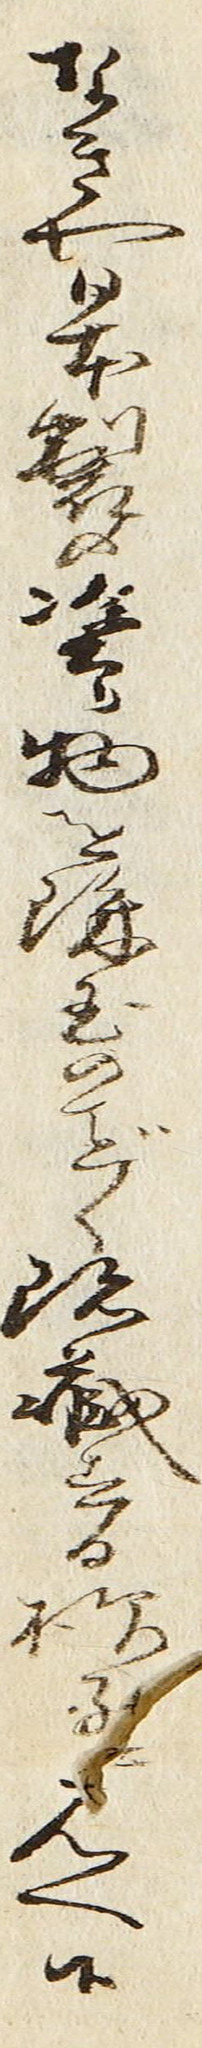なきや日本製の塗り物を珠玉のごとく珍蔵する様子ニ見へ候
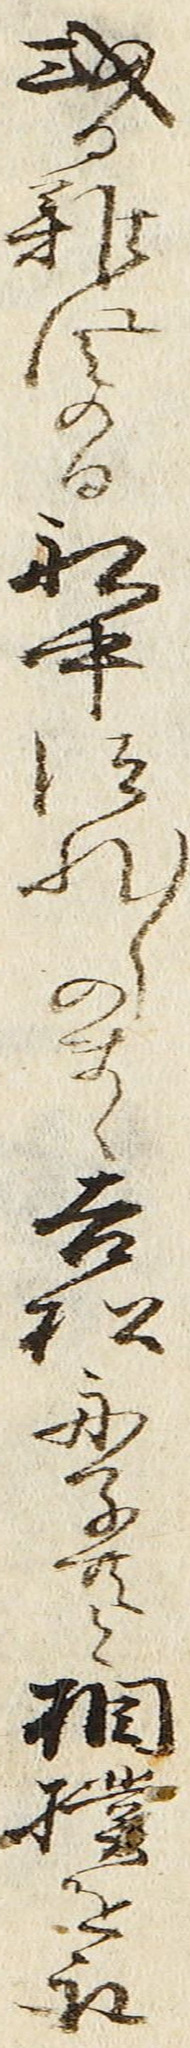或る難風の日船中つれ〳〵のまゝ吉松舟子共と相撲を取
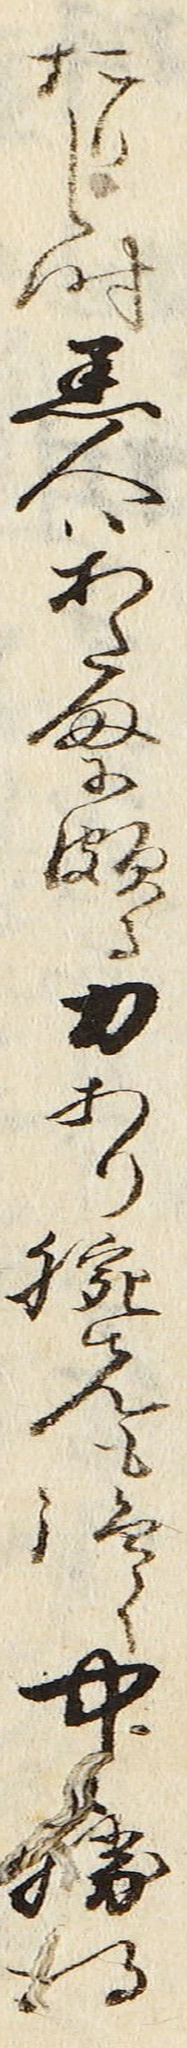たりし時黒人ハあたまに頗る力あり腕先も強く中々勝得
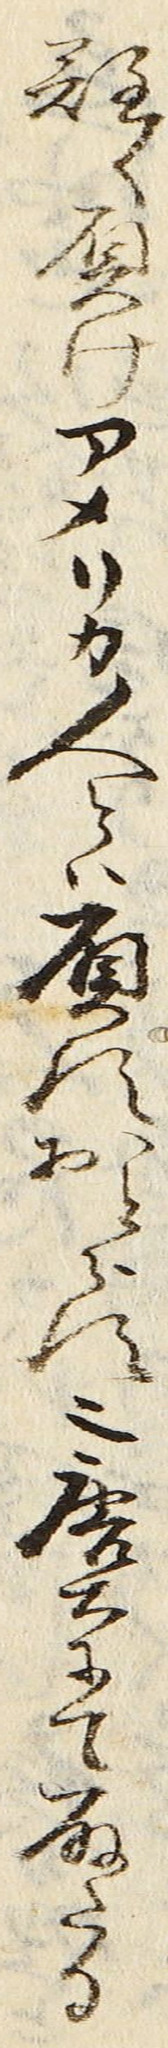難く負けアメリカ人とハ負すおとらす也唐土にて取たる
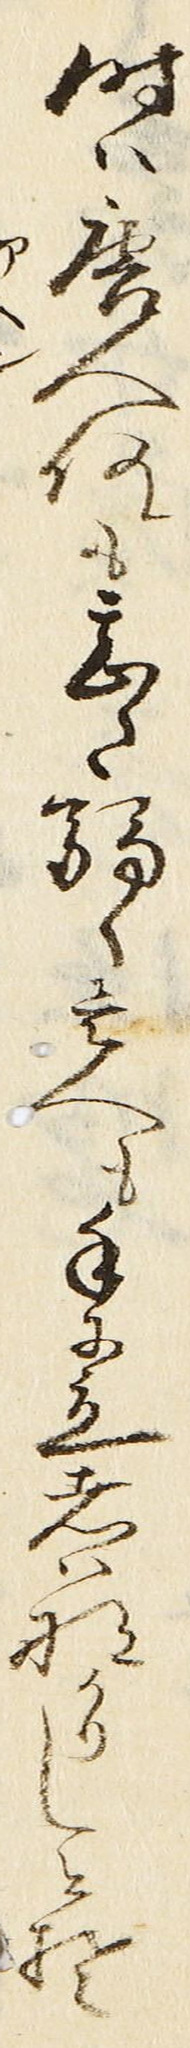時ハ唐人何レも甚た弱く壱人も手に立者ハなかりしとそ
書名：亜墨利加漂流記聞
